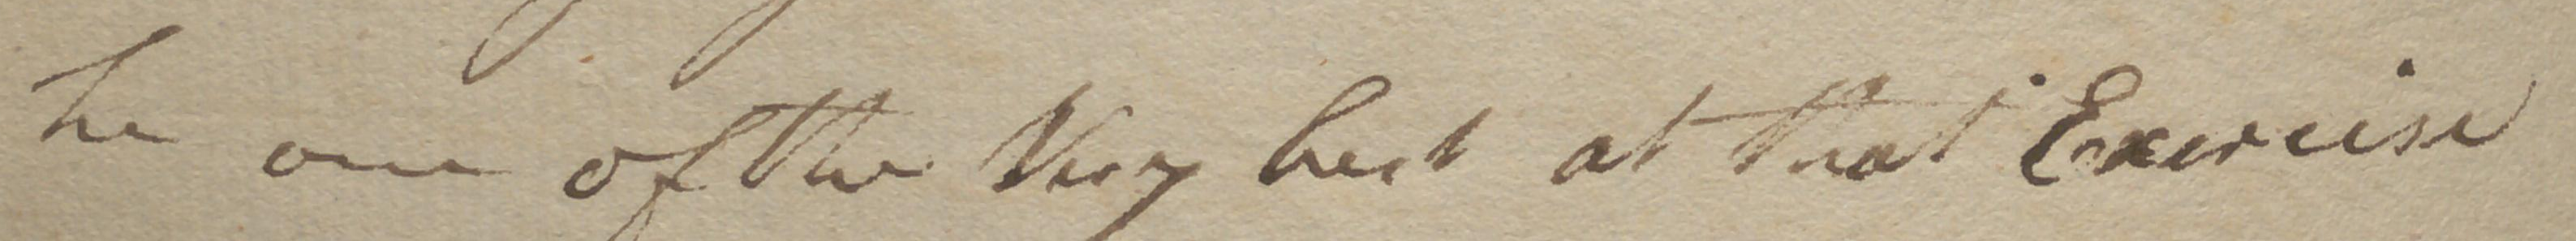he one of the Very best at that Exercise
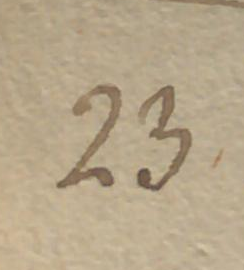23
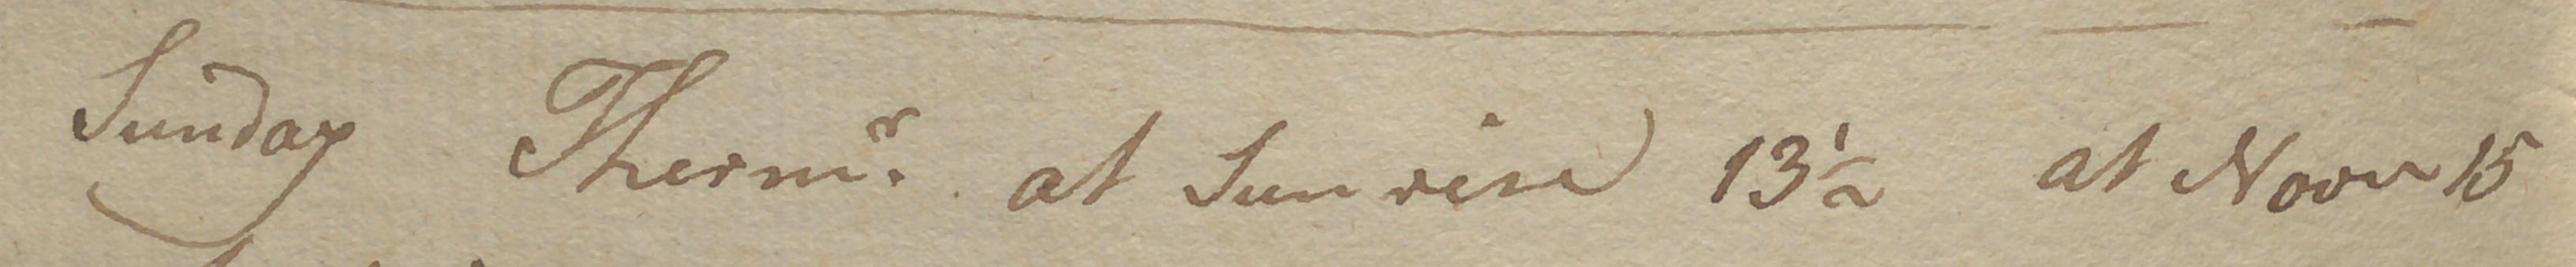Sunday Therm^r. at Sunrise 13 1/2 at Noon 15
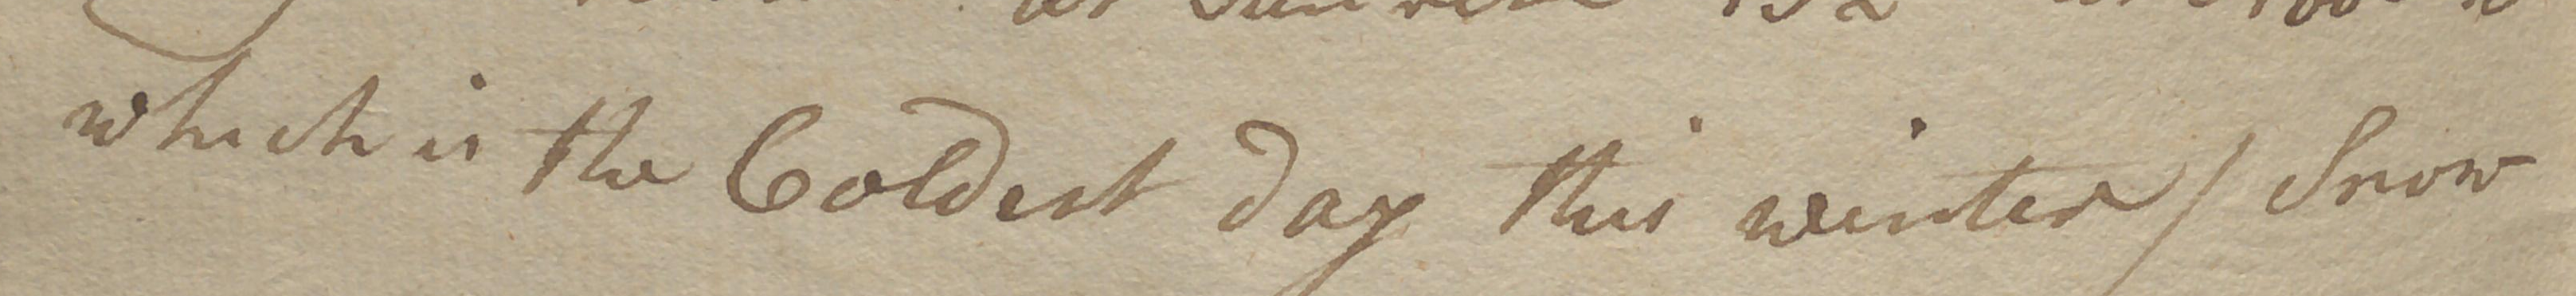which is the Coldest day this winter / Snow
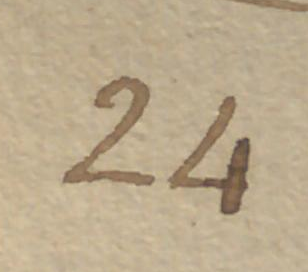24
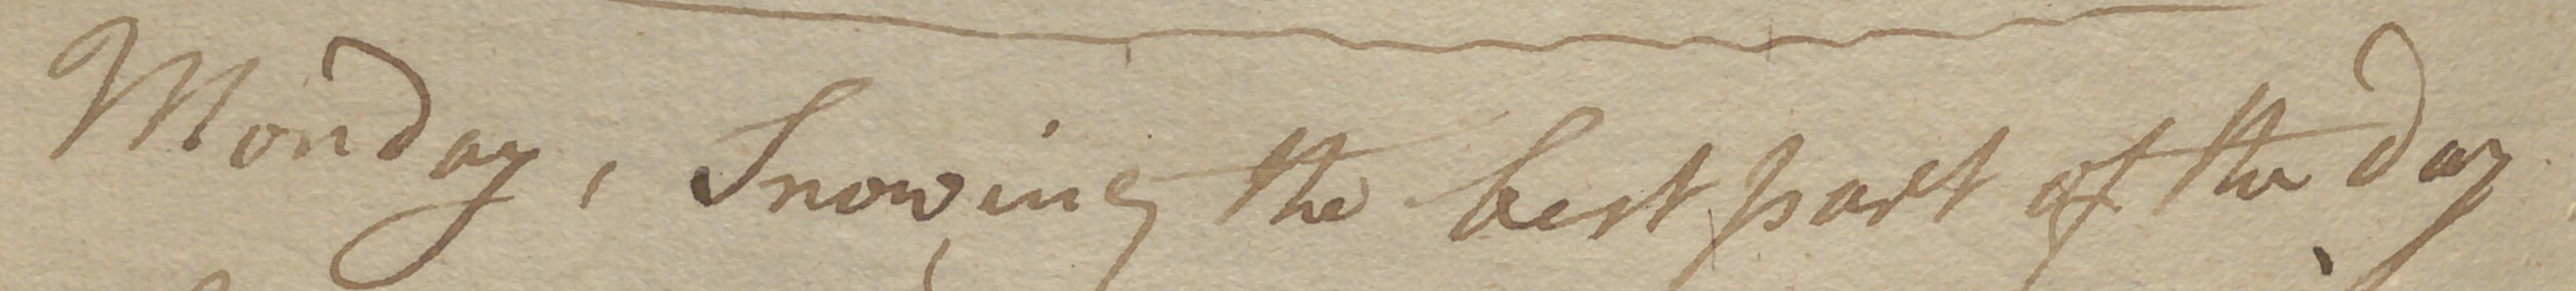Monday, Snowing the best part of the day
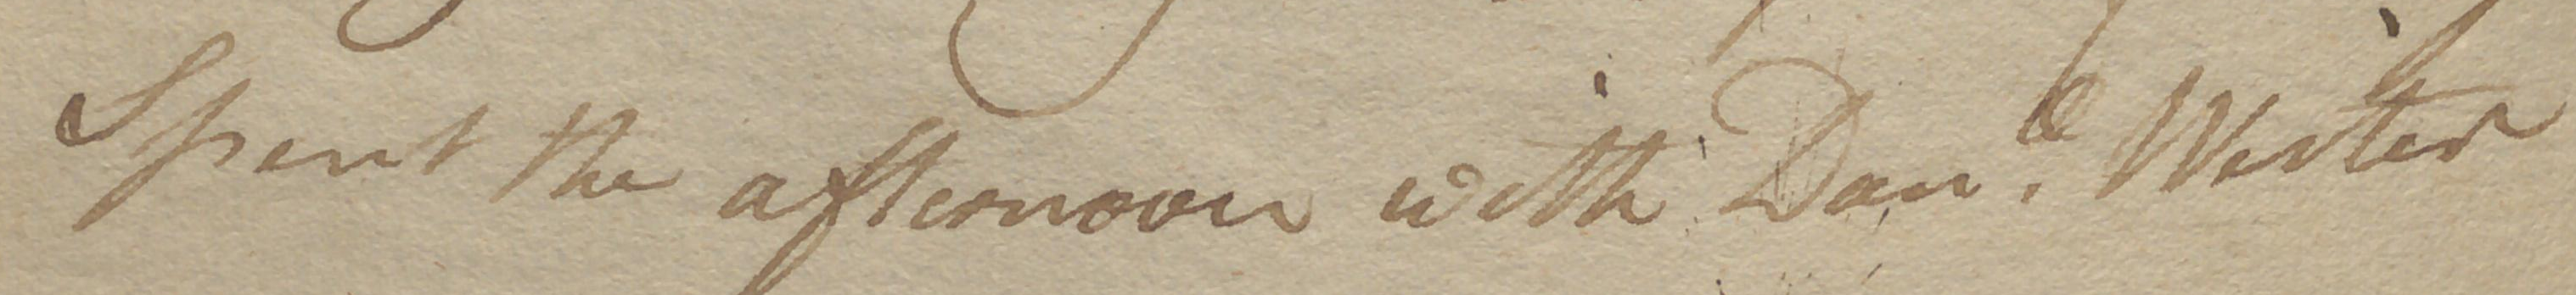spent the afternoon with Dan^l. Wister
